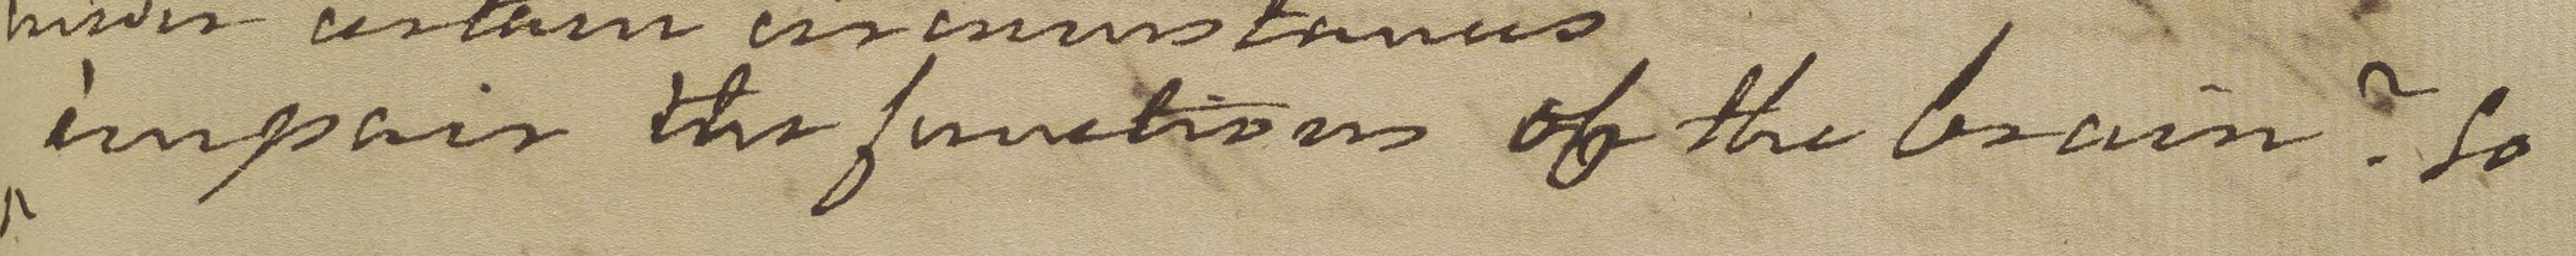impair the functions of the brain? So
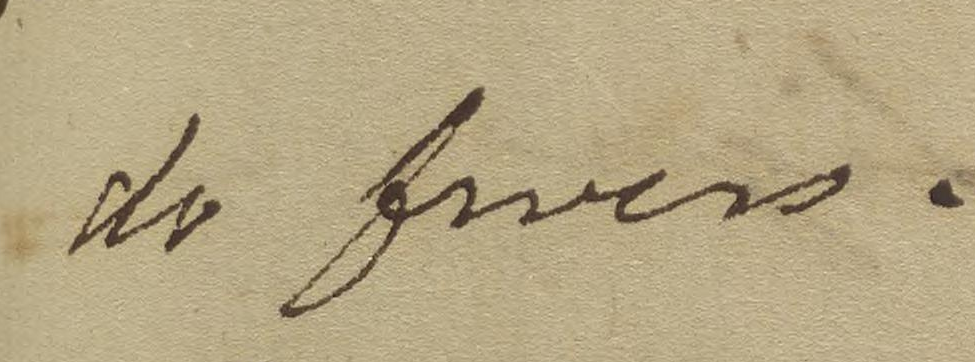do fevers.
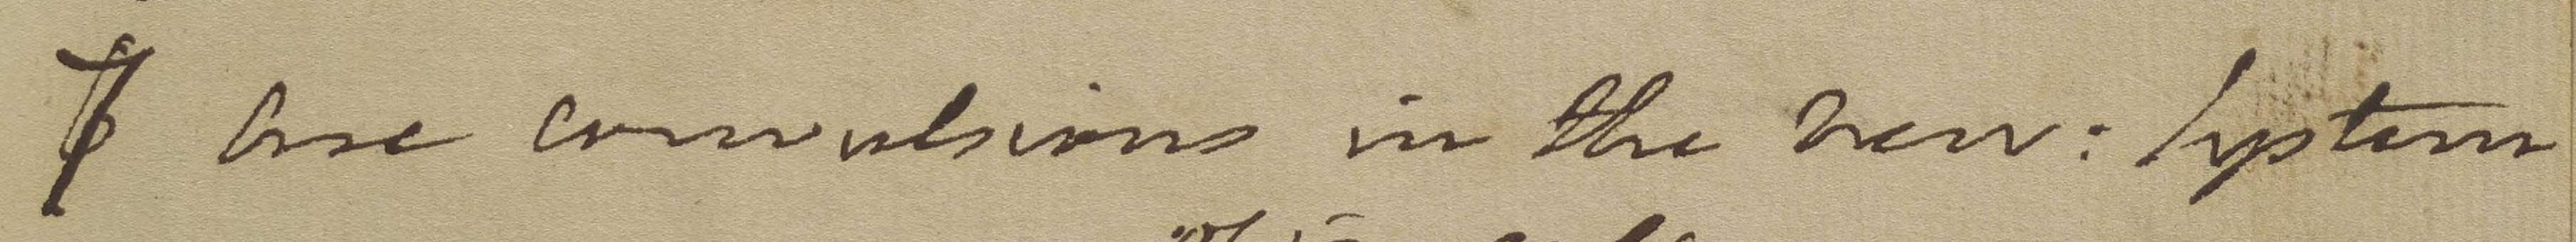7 Are convulsions in the ner. system
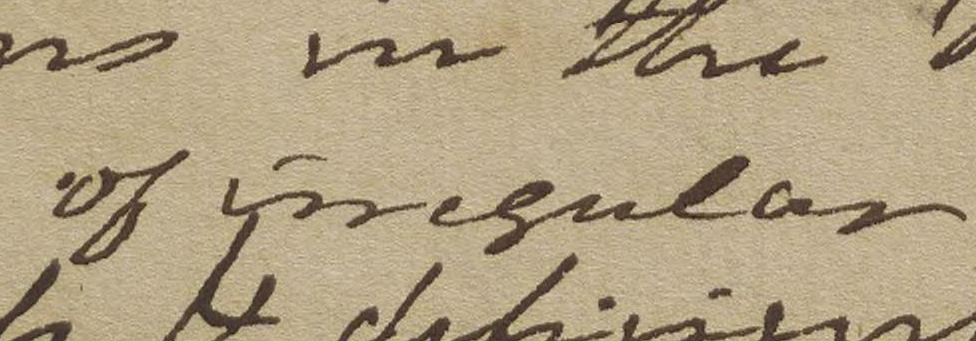of irregular
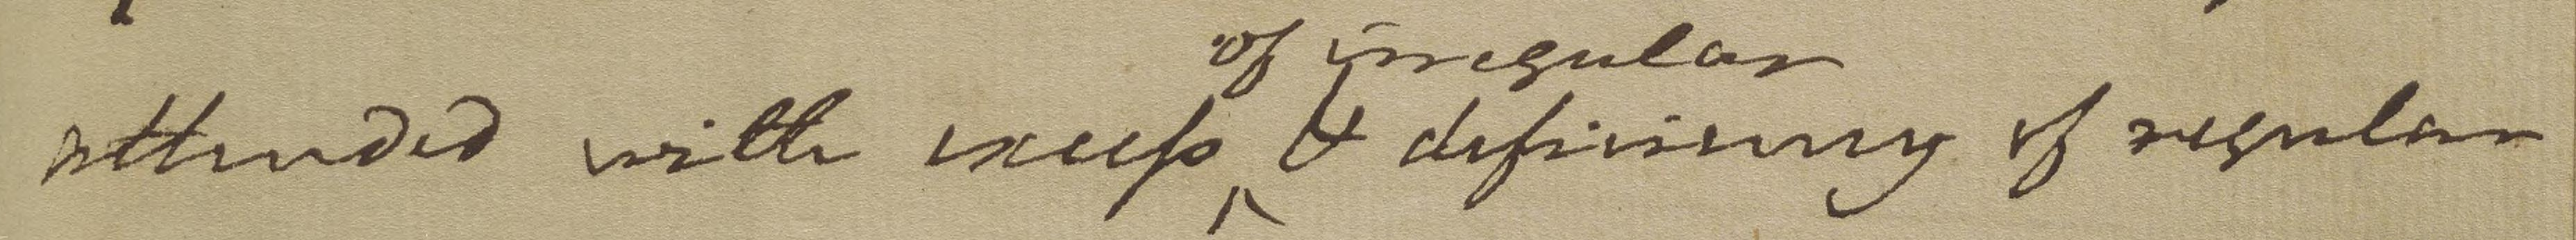attended with excess ^ & deficiency of regular
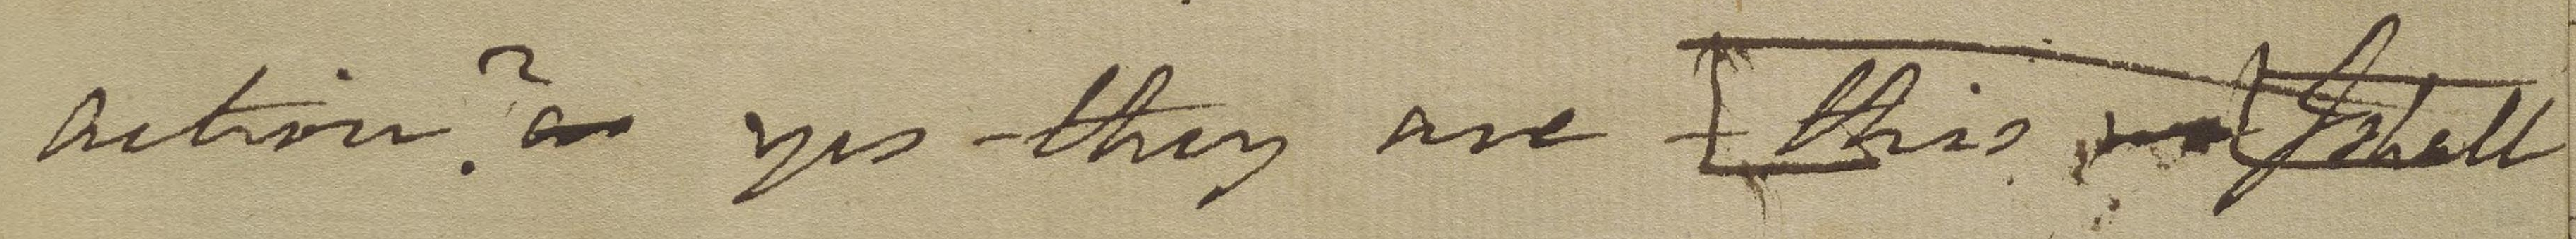action? Yes they are (This (I shall
